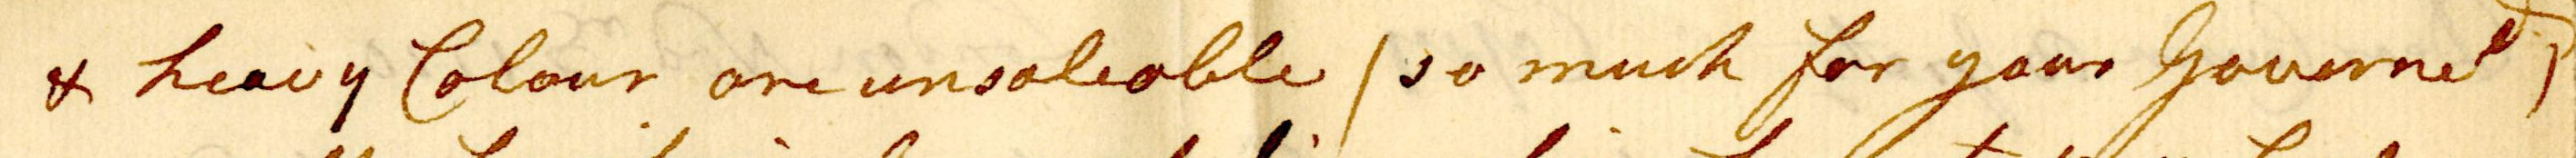& heavy Colour ore unsaleable /so much for your Governe^t/
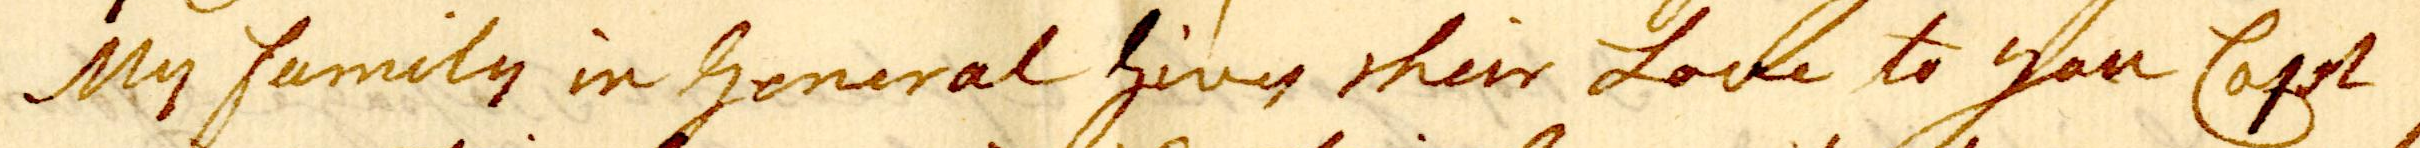My family in General Gives their Love to you Cap^t
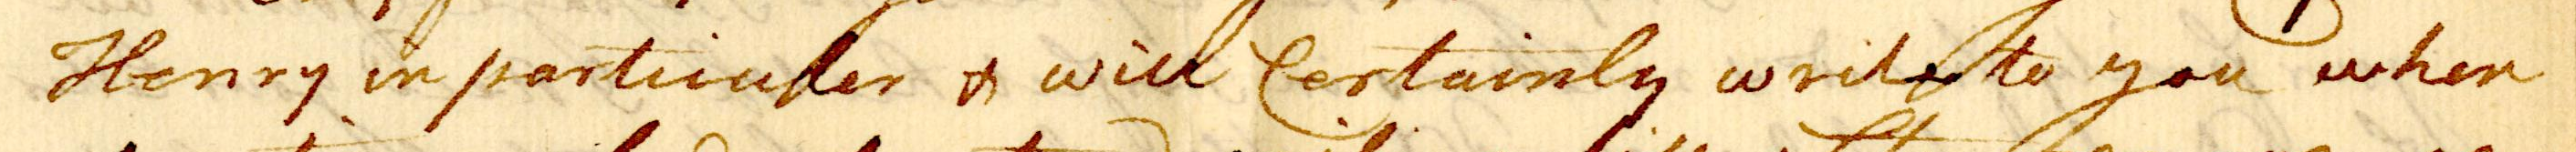Henry in particular & will Certainly write to you when
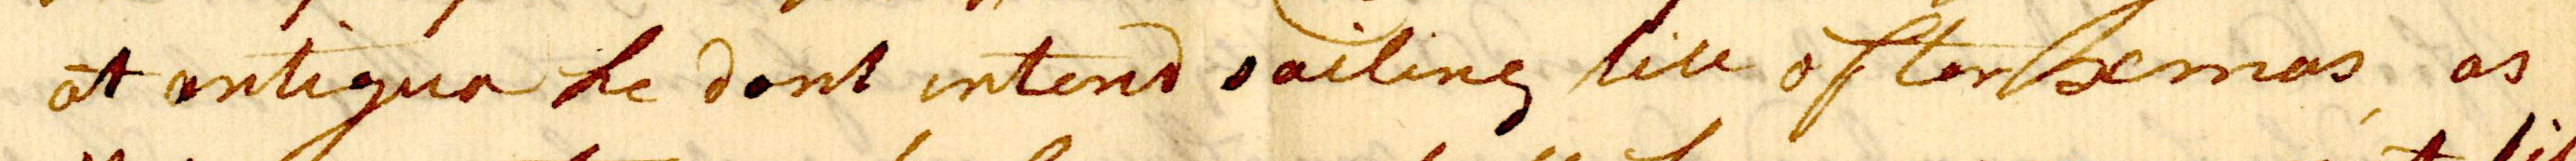at Antigua he dont intend sailing till after xmas as
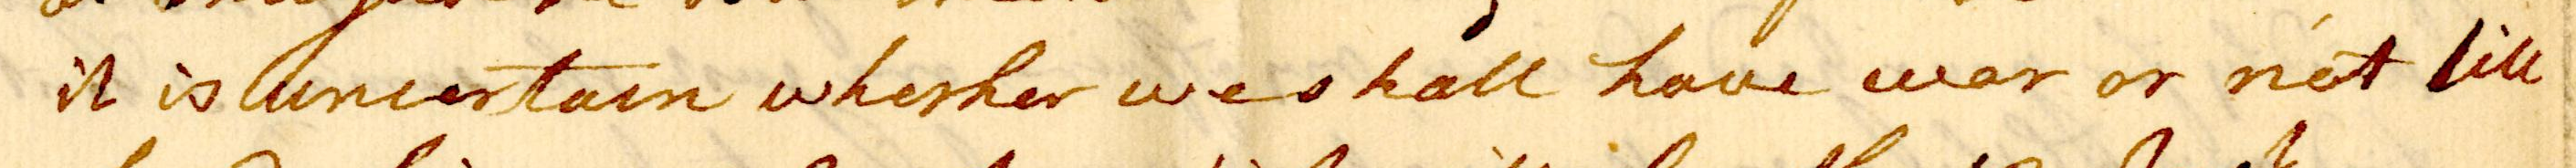it is uncertain whether we shall have war or not till
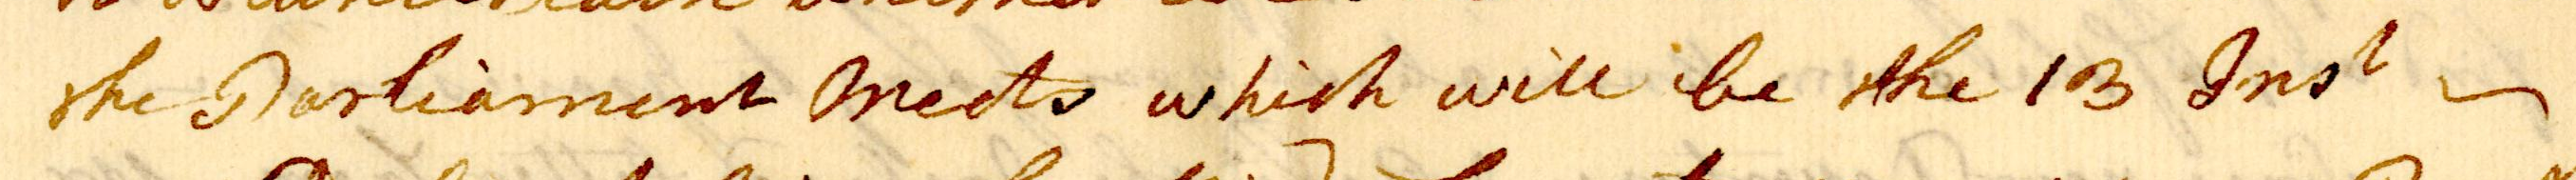the Parliament meets which will be the 13 Ins^t.-
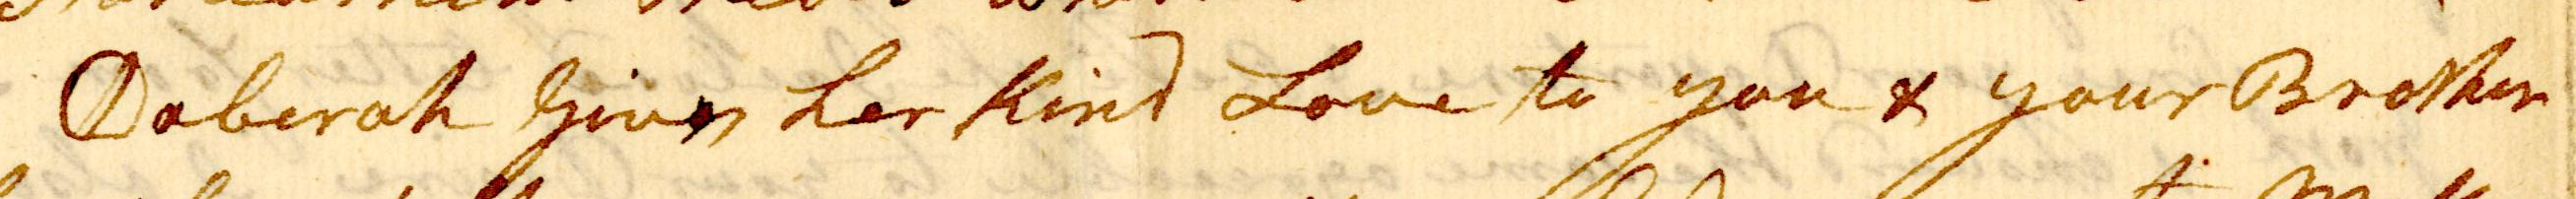Daberah gives her kind Love to you & your Brother
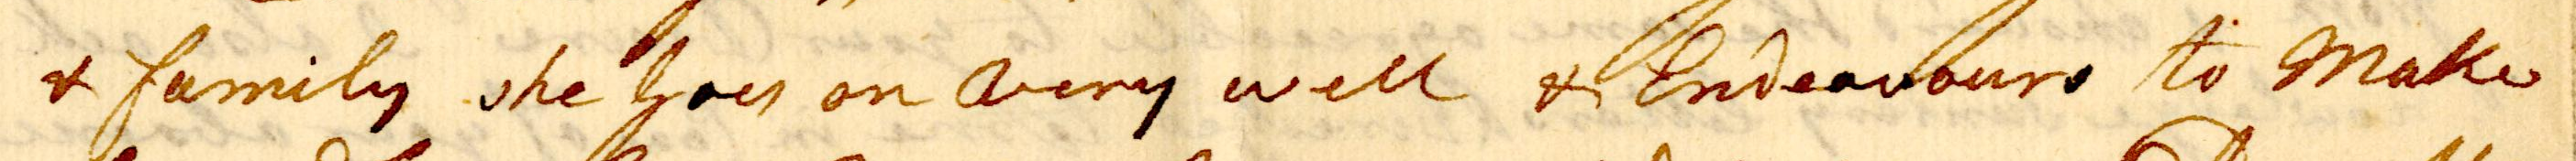& family she goes on very well & Endeavours to Make
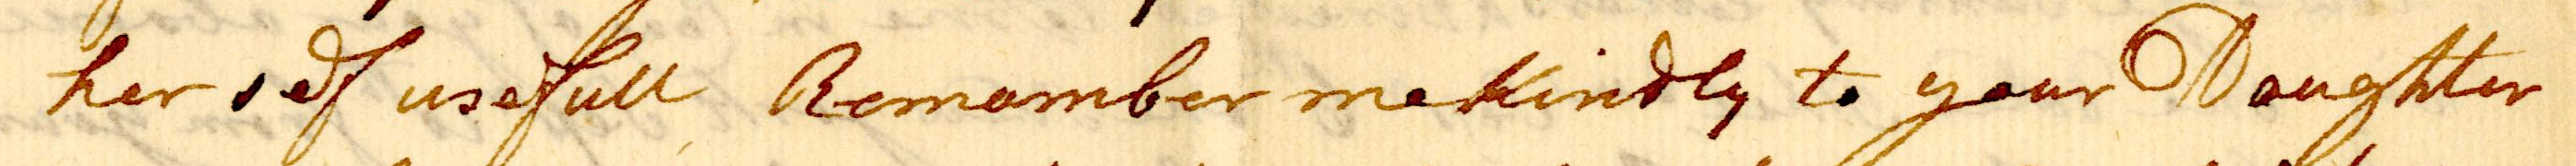her self usefull Remember me kindly to your Daughter
